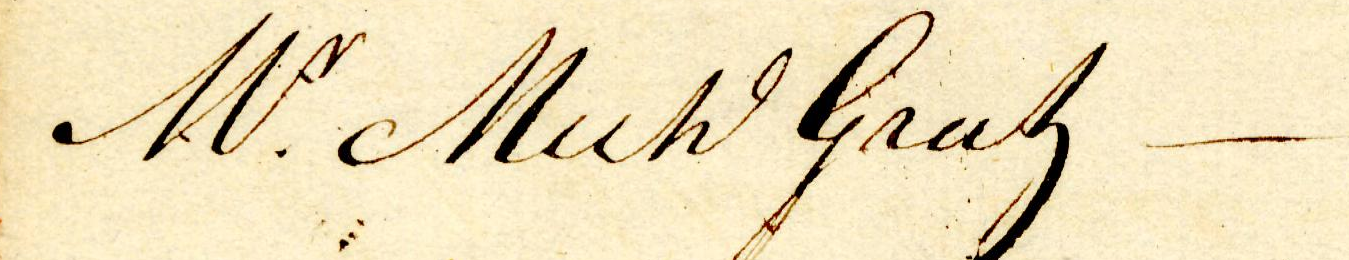M^r Mich^l Gratz
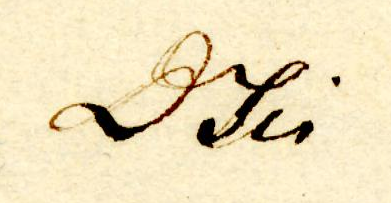D Sir
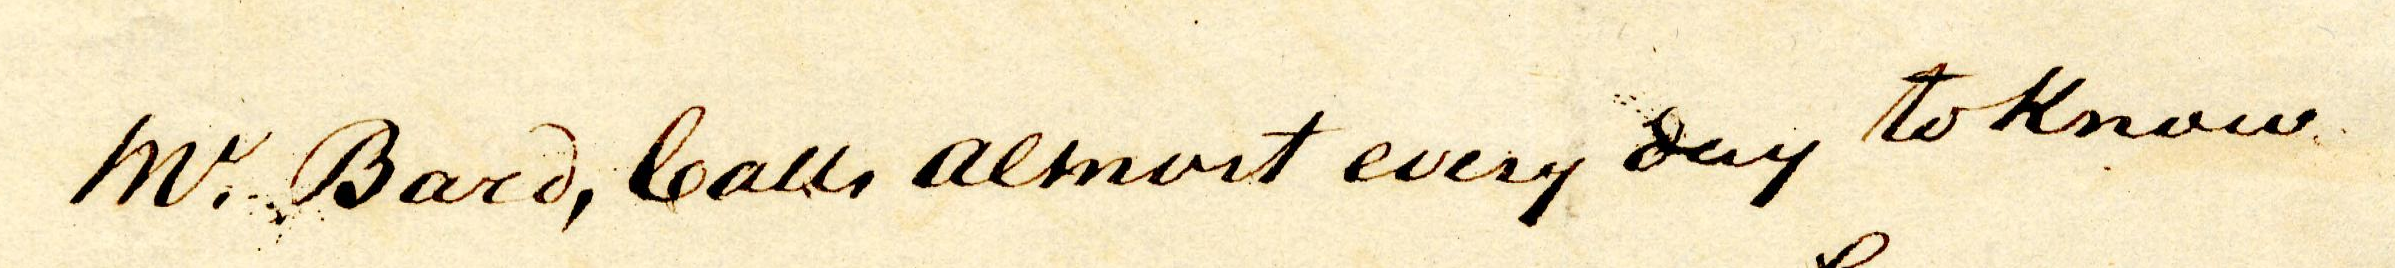M^r. Bard, calls almost every day to know.
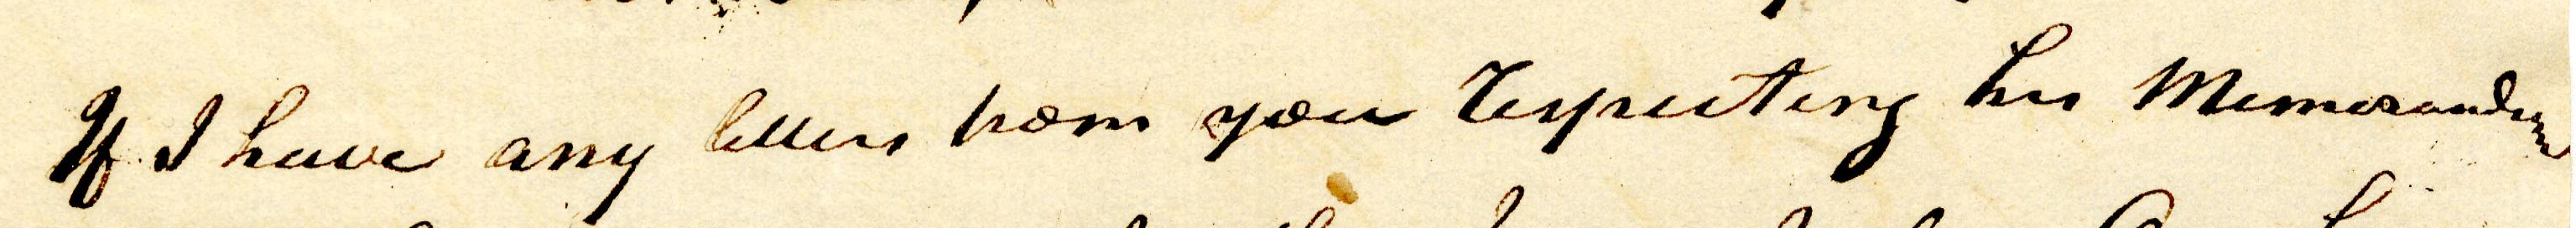If I have any letters from you respecting his memorandum
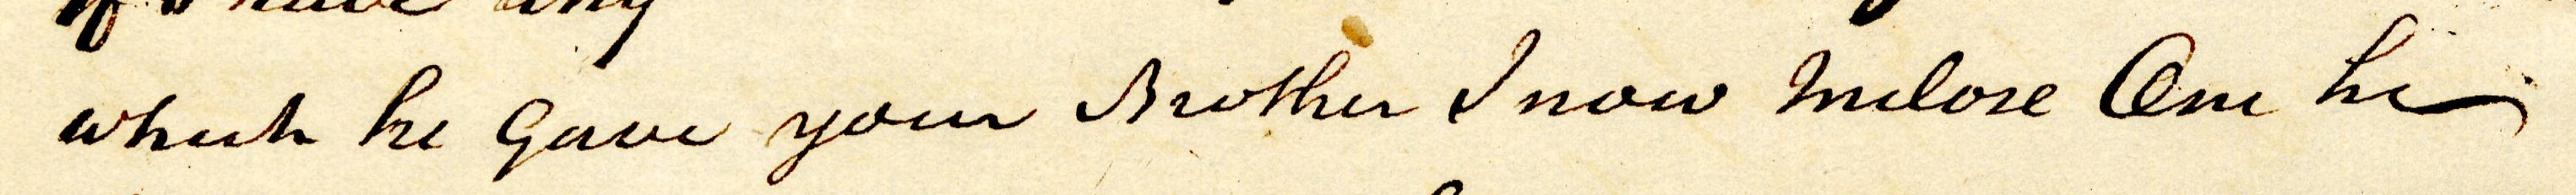which he gave your Brother I now Inclose one he
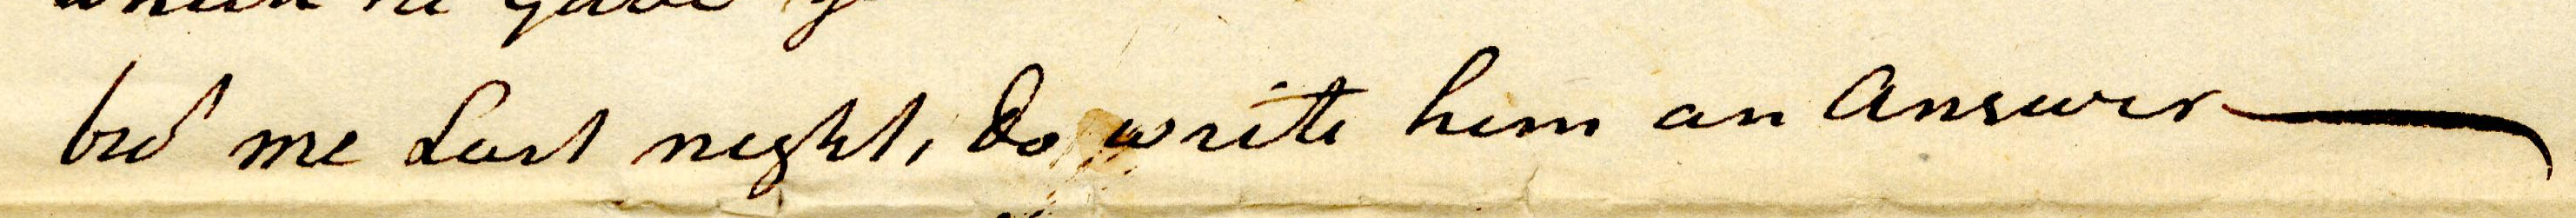bro^t me last night, do write him an Answer-
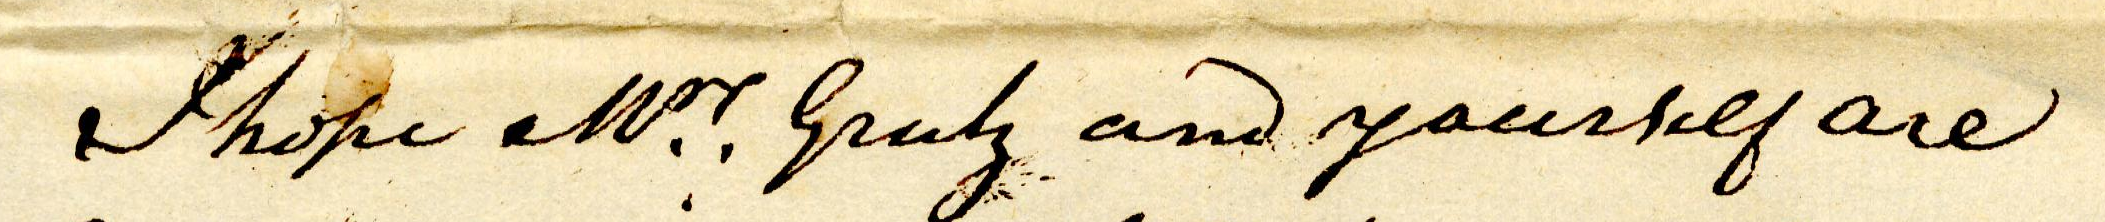I hope M^r Gratz and yourself are
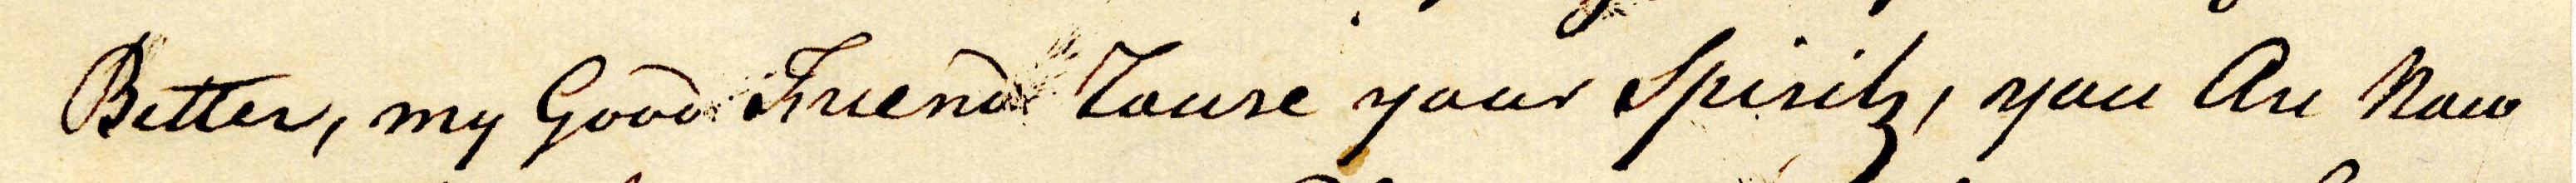Better, my good Friend rouse your Spiritz, you Are now
